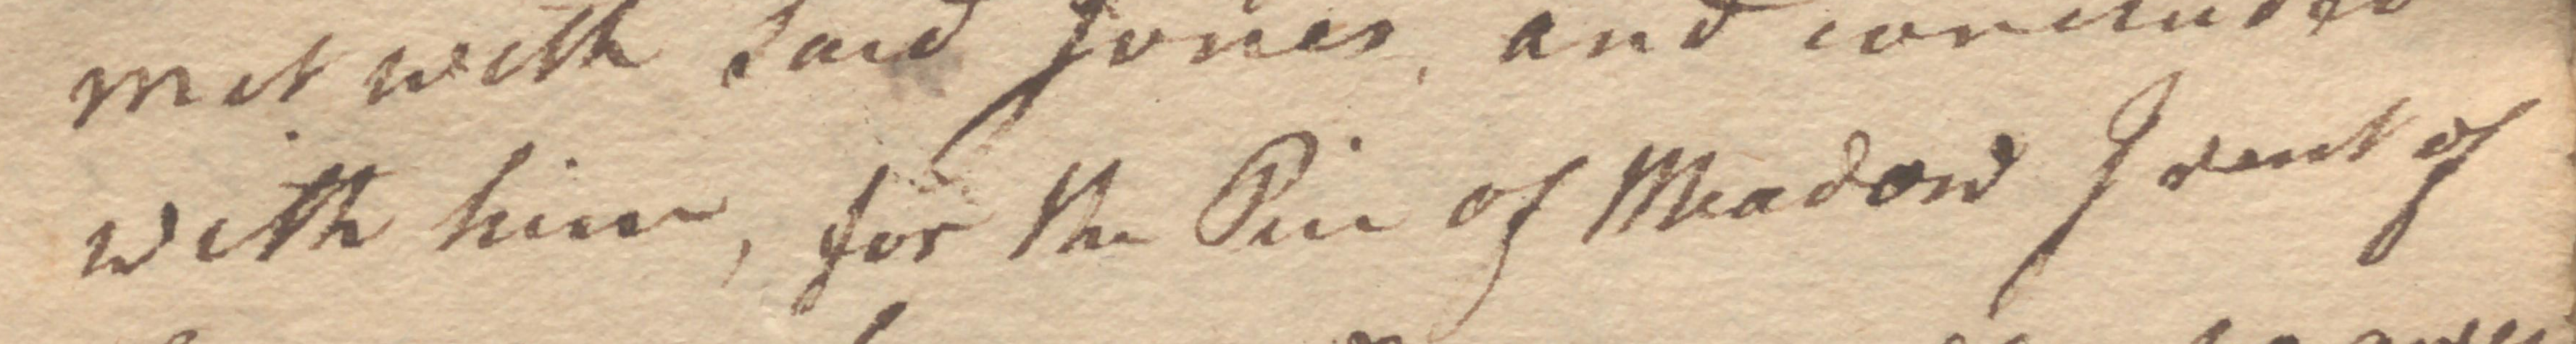with him, for the Pice of Meadow I rent of
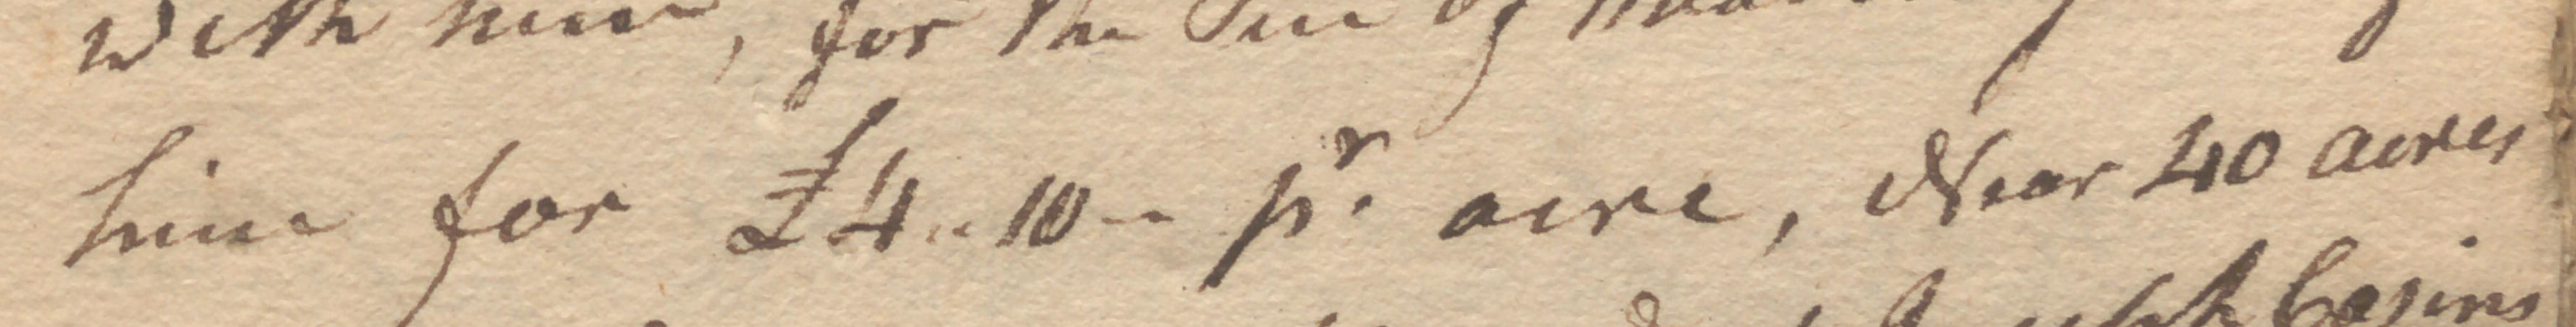him for £4..10- p^r. acre, Near 40 acres
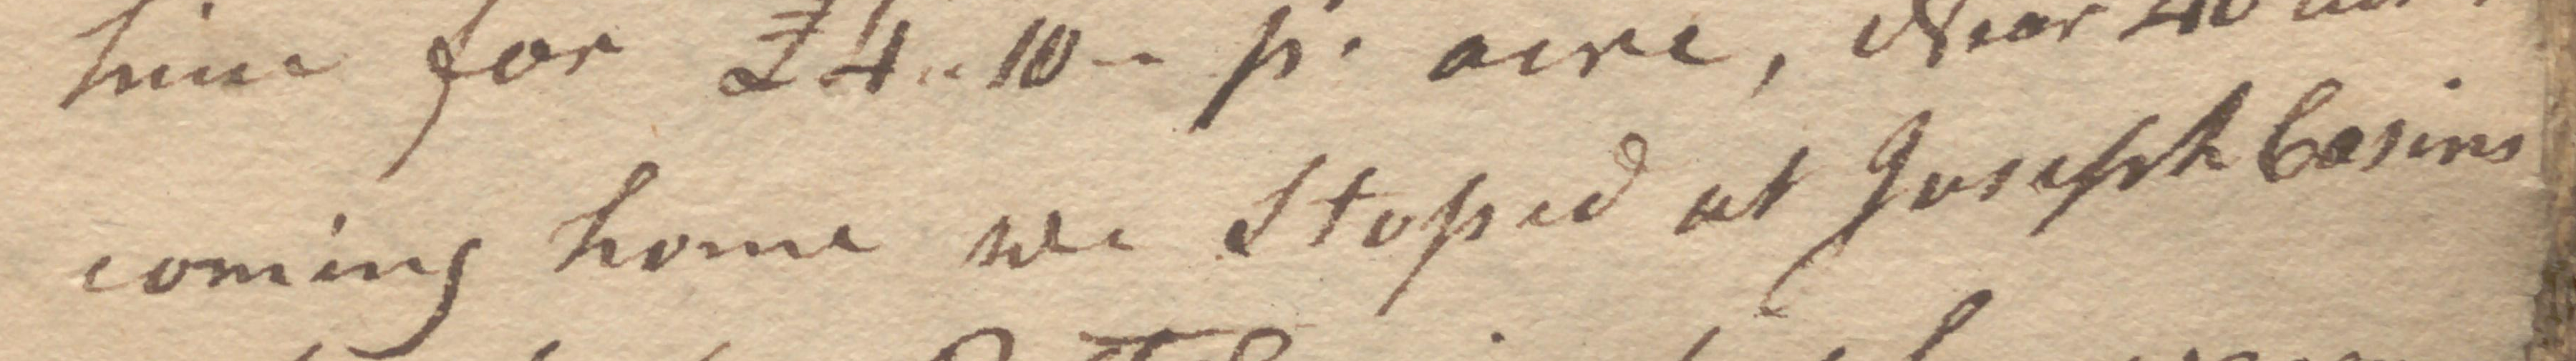coming home we stoped at Joseph Casins
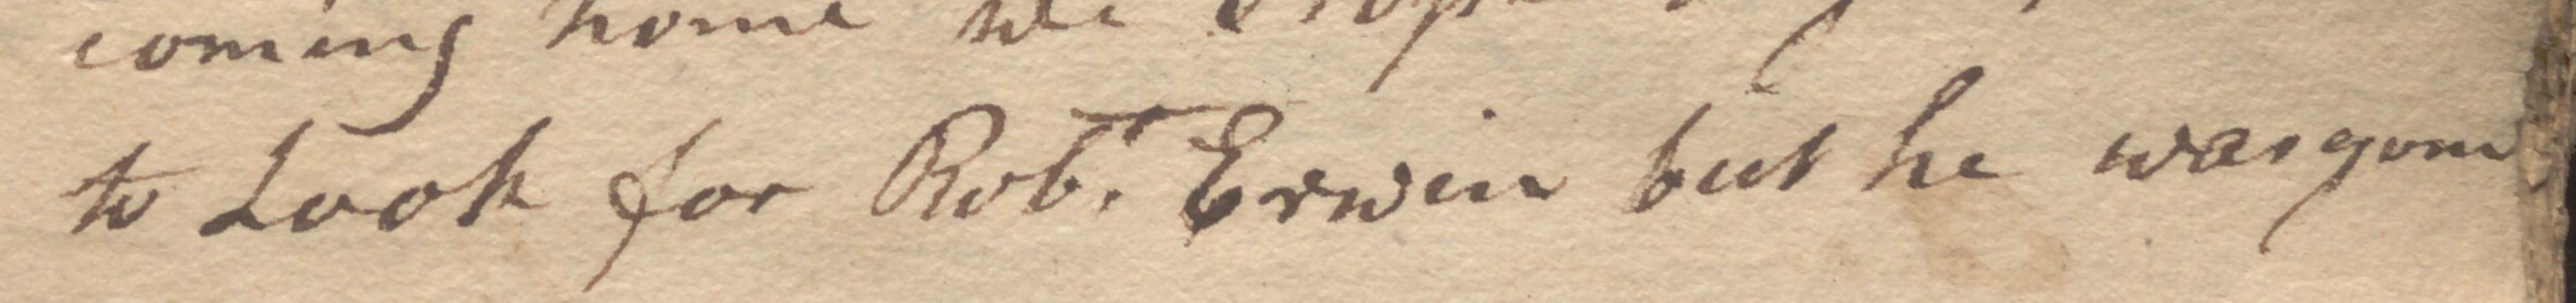to Look for Rob^t. Erwin but he was gone
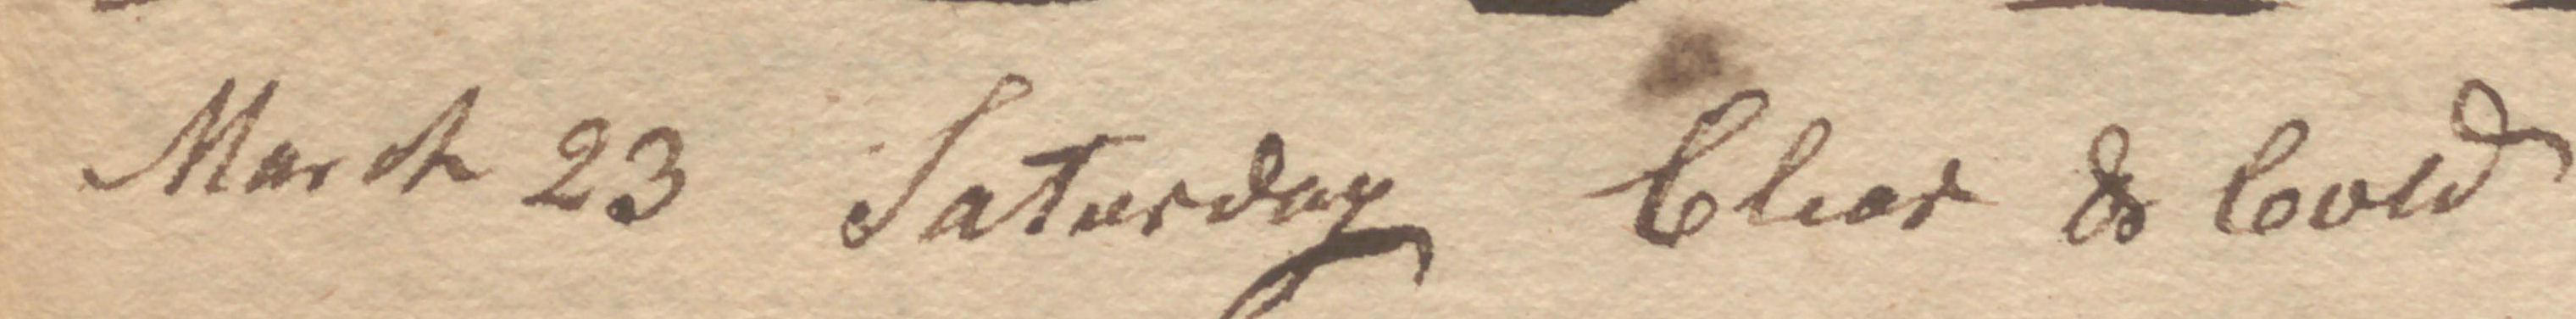March 23 Saturday Clear & Cold
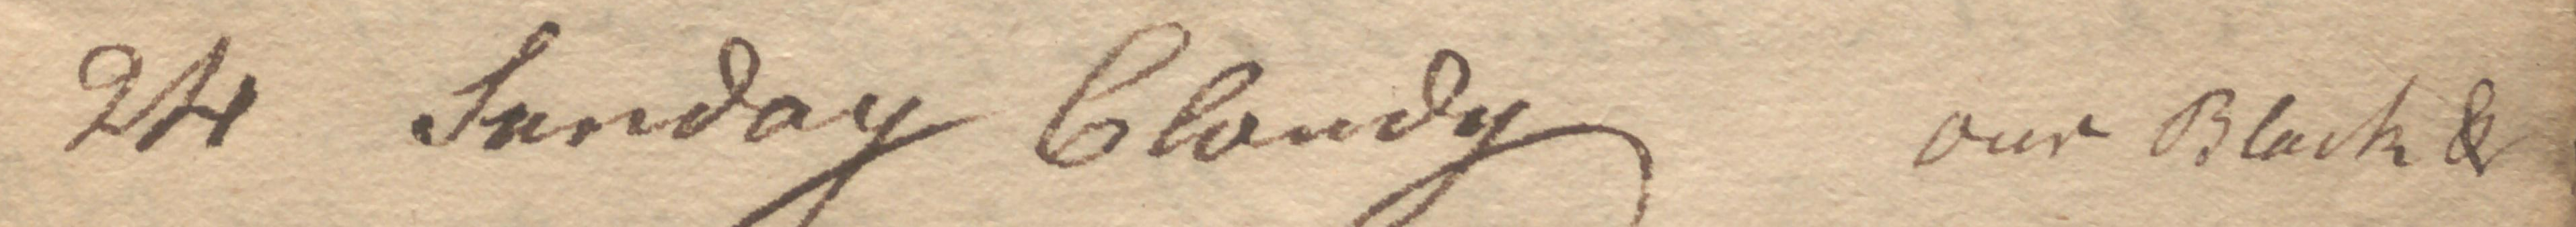24 Sunday Clondy our Black &
